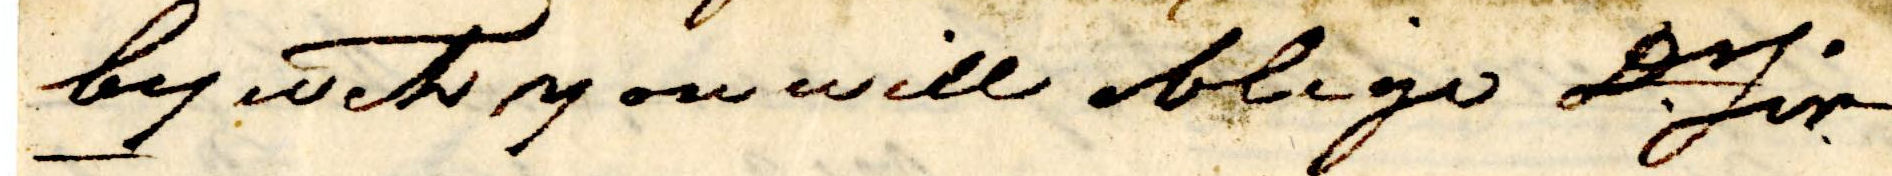by wch you will oblige D^r. Sir,
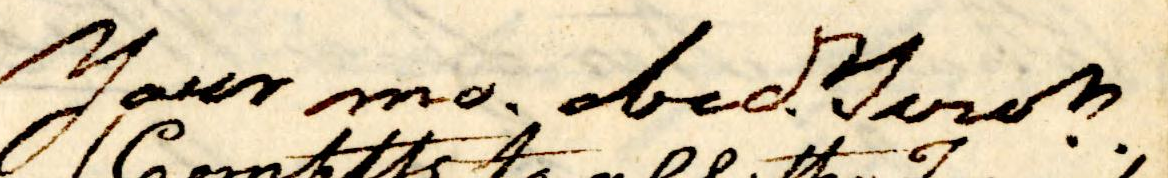Your mo. obed. Serv^t.
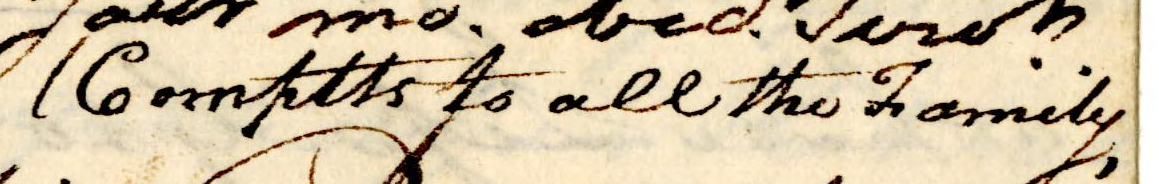Comptts to all the Family
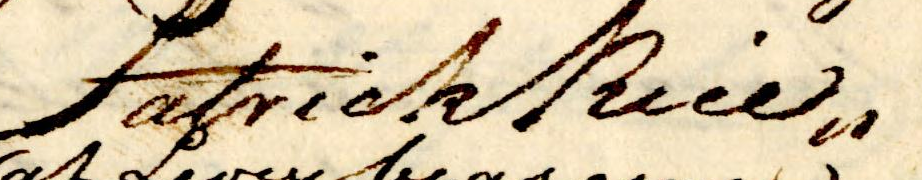Patrick Rice
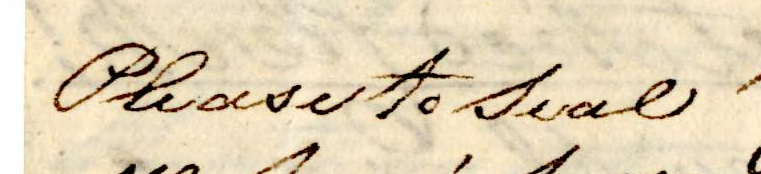Please to seal
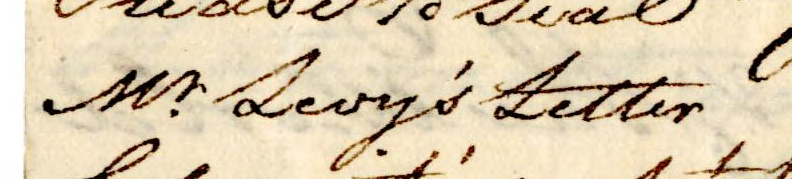M^r. Levy's Letter
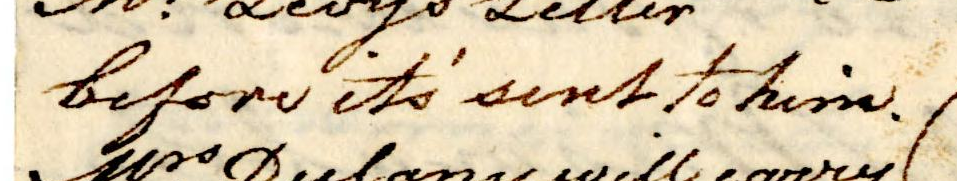before it's sent to him.
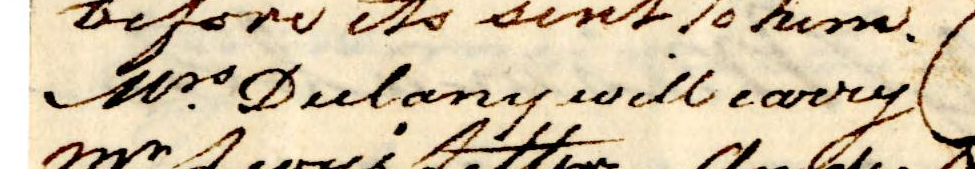M^rs. Dulany will carry
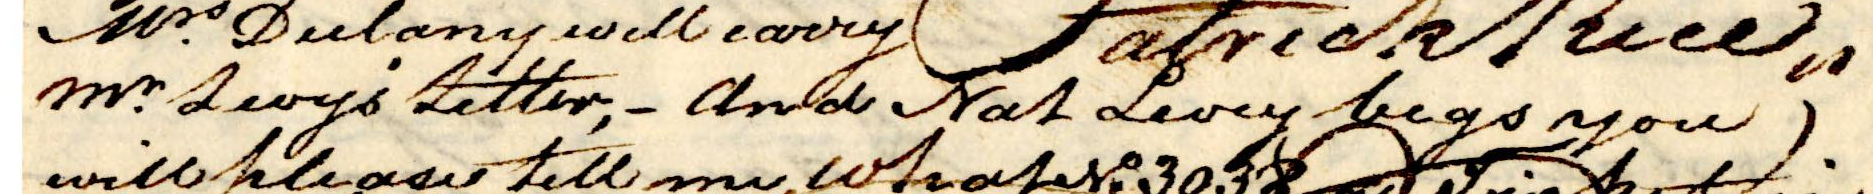m^r Levy's Letter,- And Nat Levey begs you
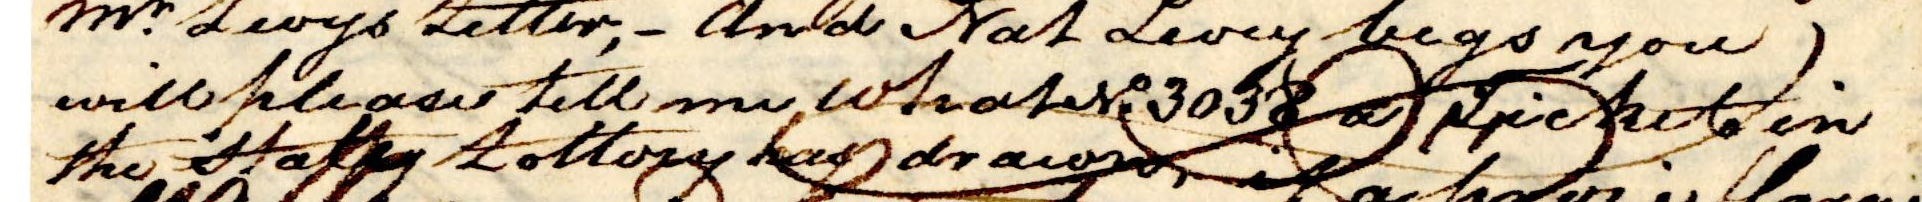will please tell me, what N^o 3038 @ Ticket in
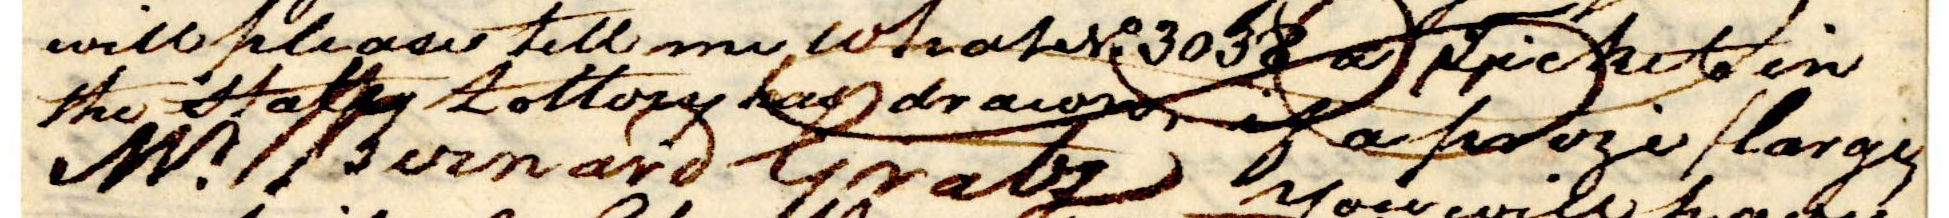the istall Lottory has drawn if a prize large
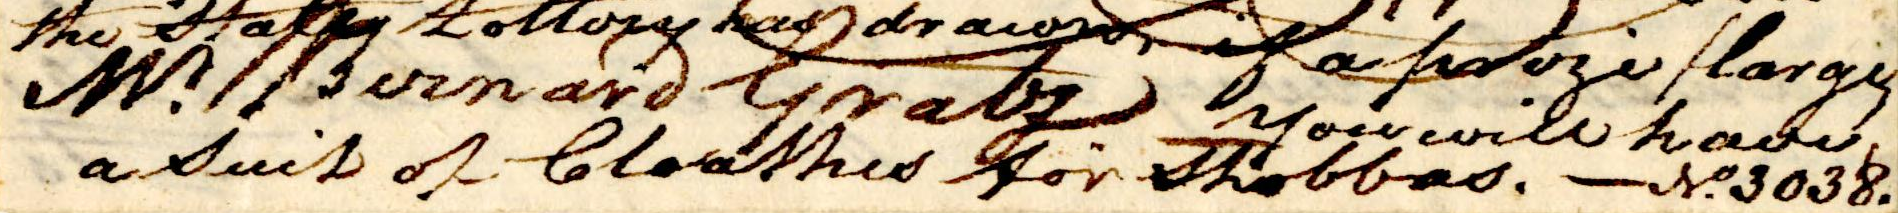M^r Barnard Gratz you will have
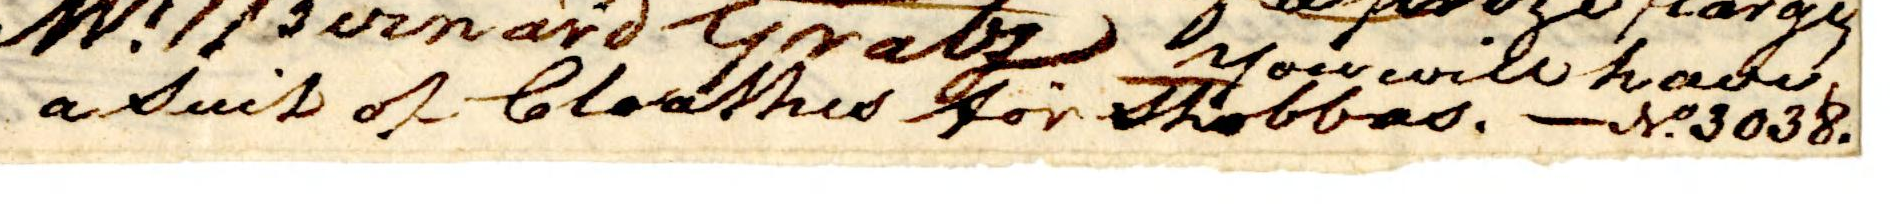a suit of Cloathes for Shabbas.- N^o 3038.
